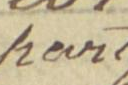partly
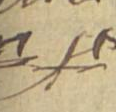-n p
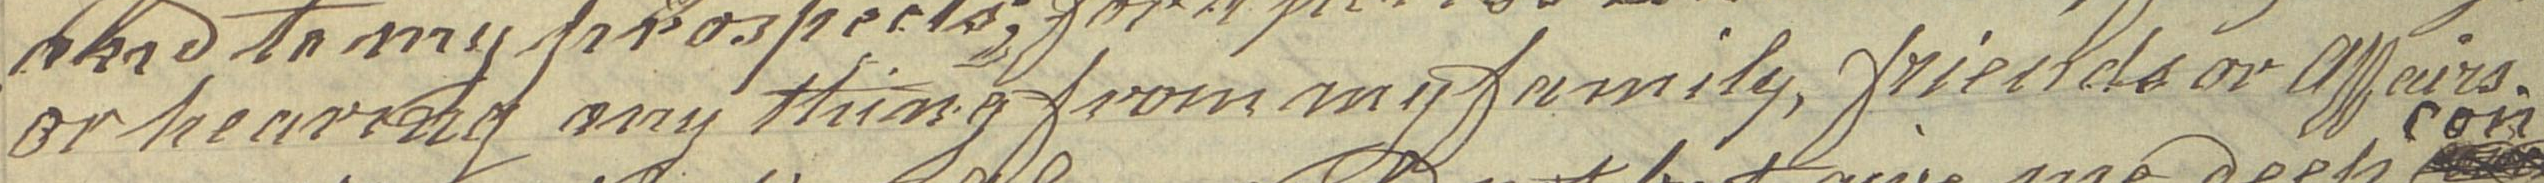or hearing my thing from my family, friends or Affairs,
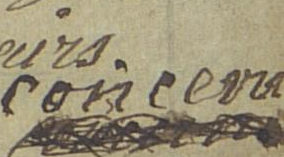concern
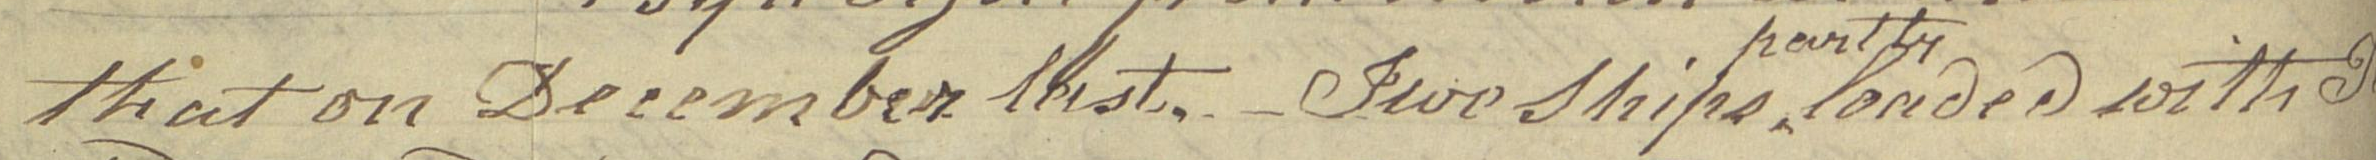that on December last. Two ships ^ landed with
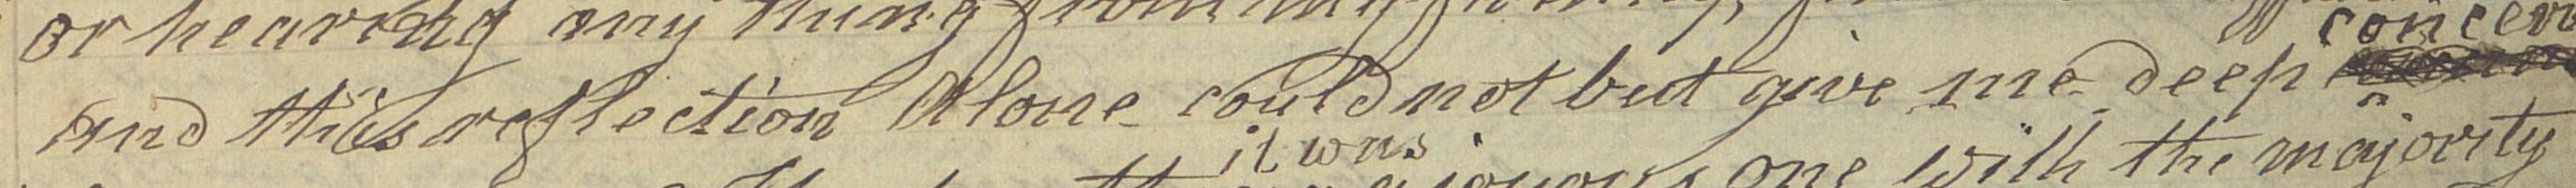and this reflection Alone could not but give me deep ^ [____]
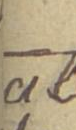-al
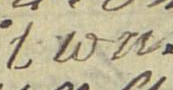it was
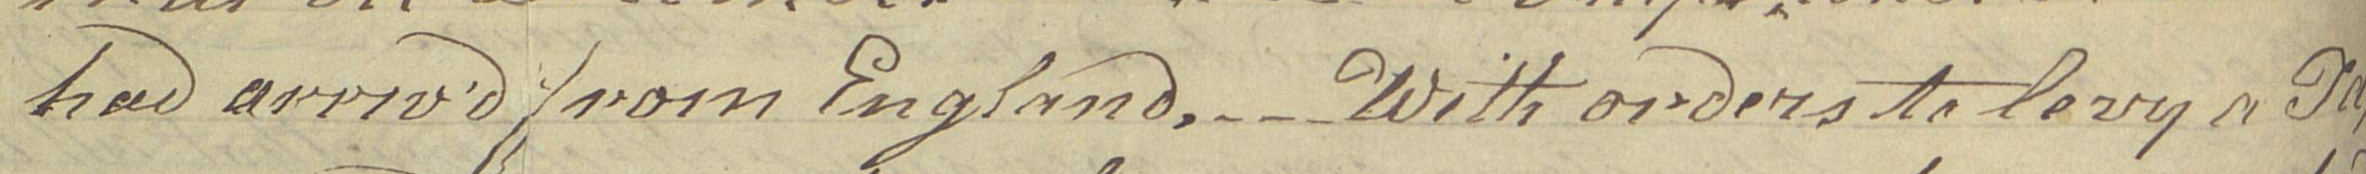had arriv'd from England. With orders to levy a Ta-
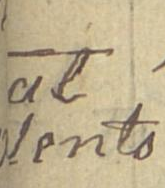-lents
